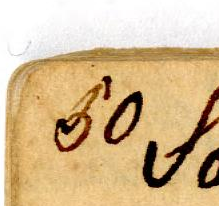50
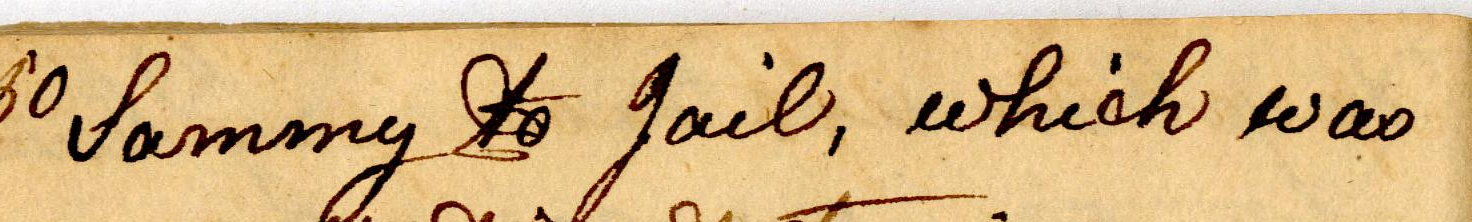Sammy to Jail, which was
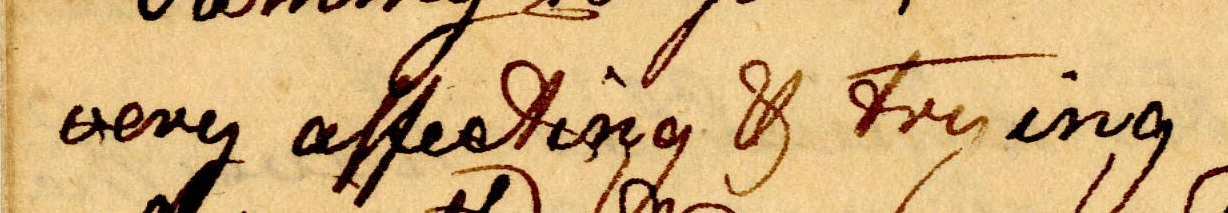very affecting & trying
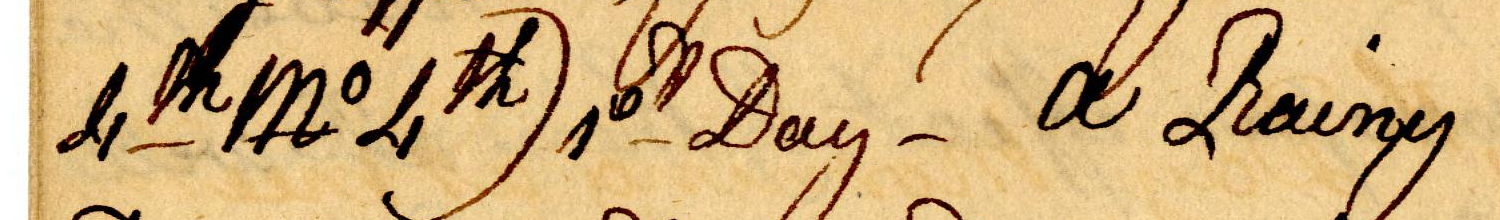4^th M^o 4^th) 1^st Day- A Rainy
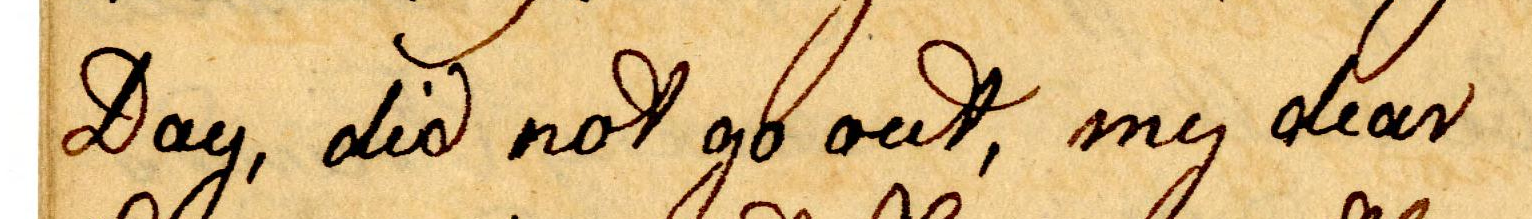Day, did not go out, my dear
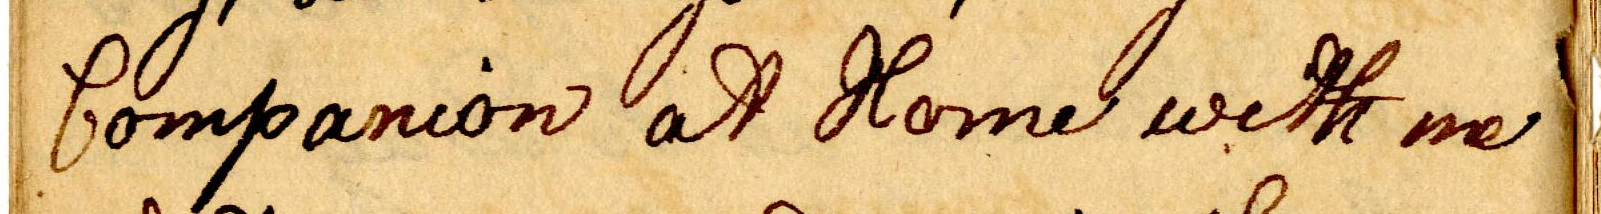Companion at Home with me
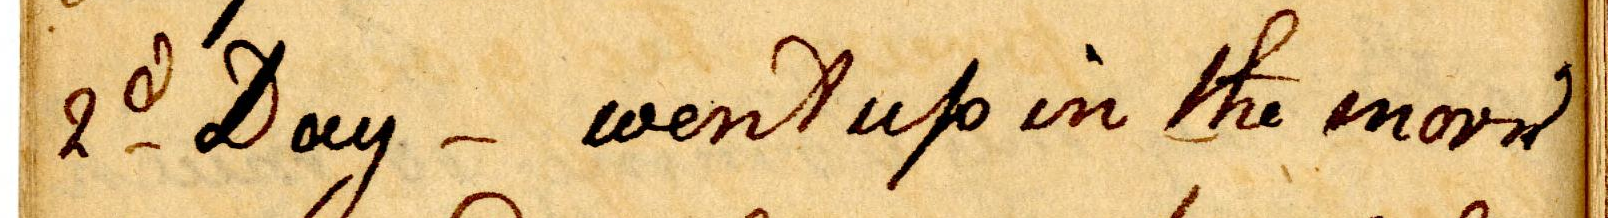2^d- Day- went up in the morn^g
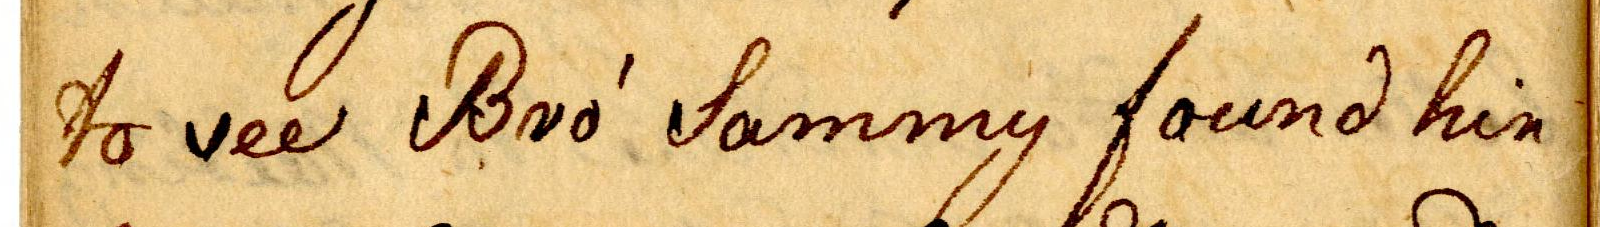to see Bro' Sammy found hin
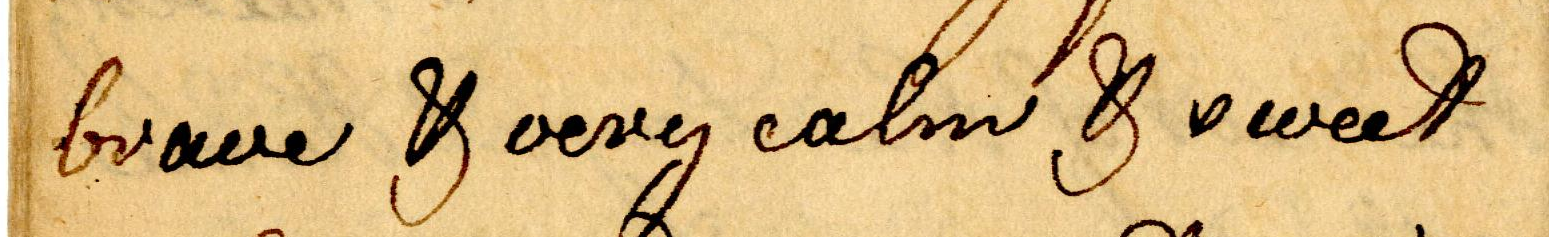brave & very calm & sweet
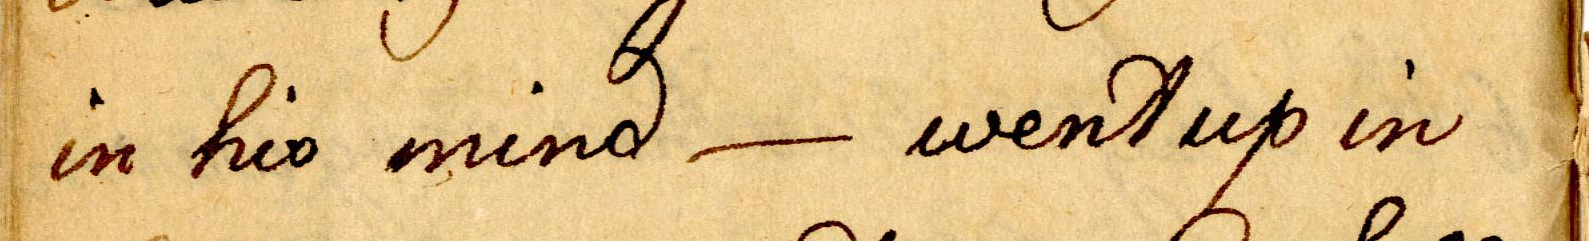in his mind- went up in
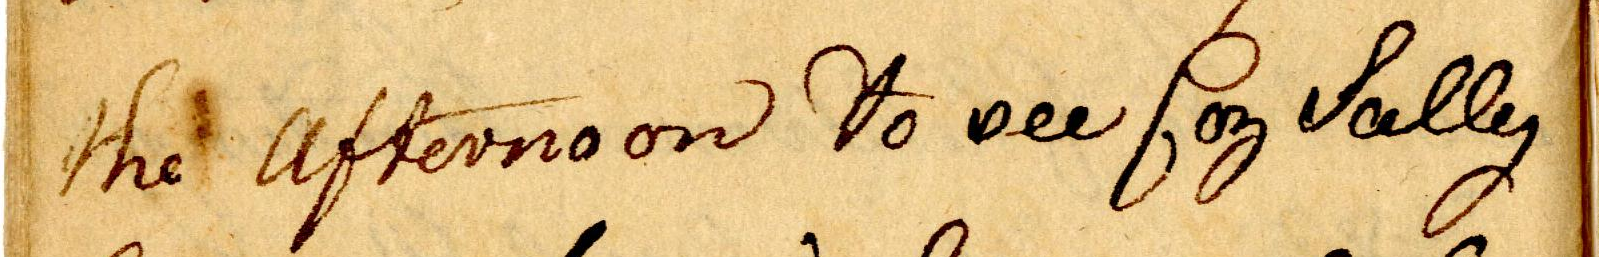the Afternoon to see Coz Sally
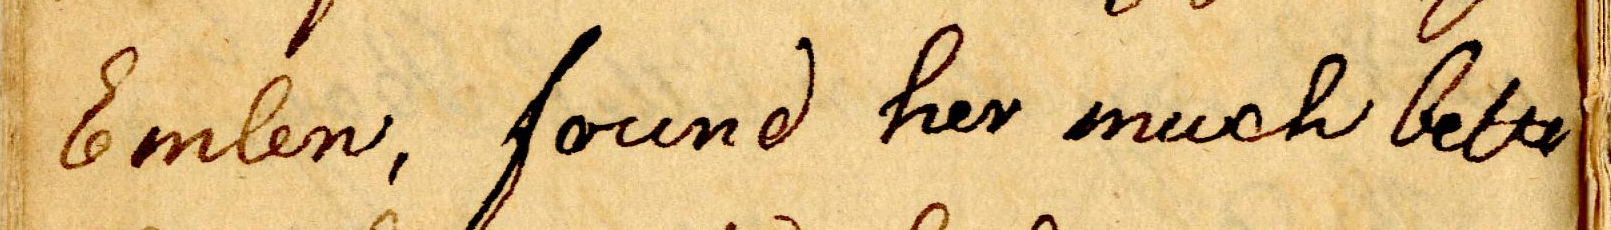Emlen, found her much bette
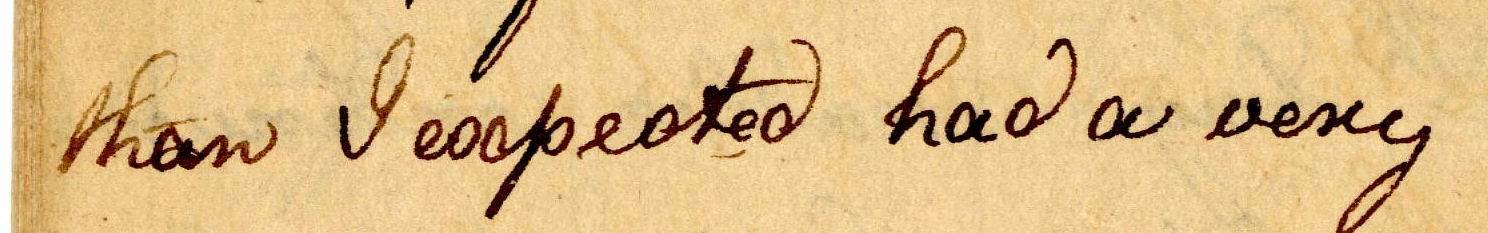than I expected had a very
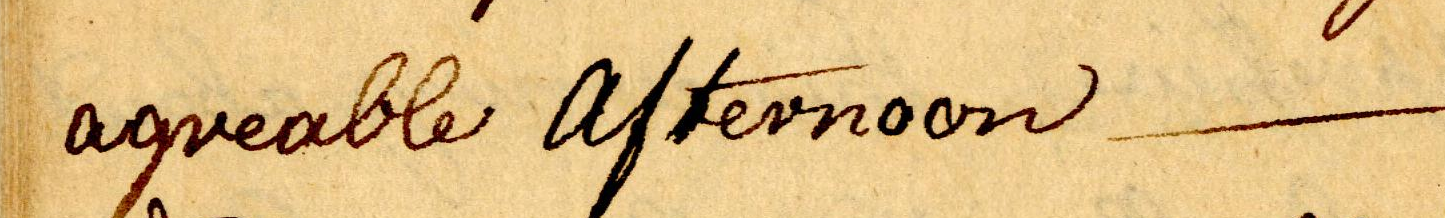agreable Afternoon-
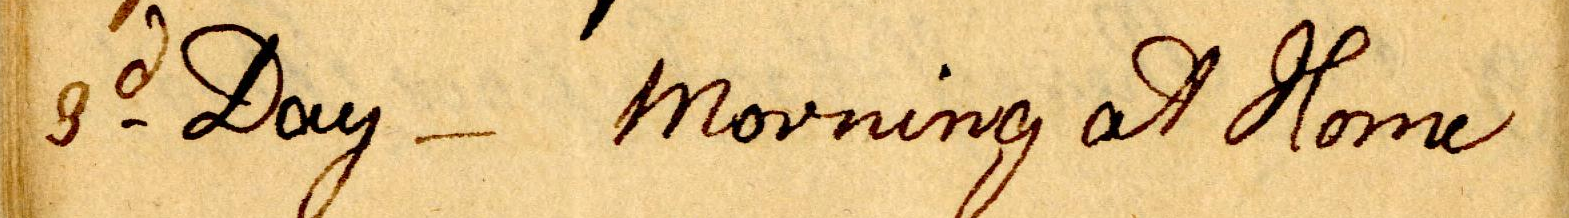3^d Day- Morning at Home
